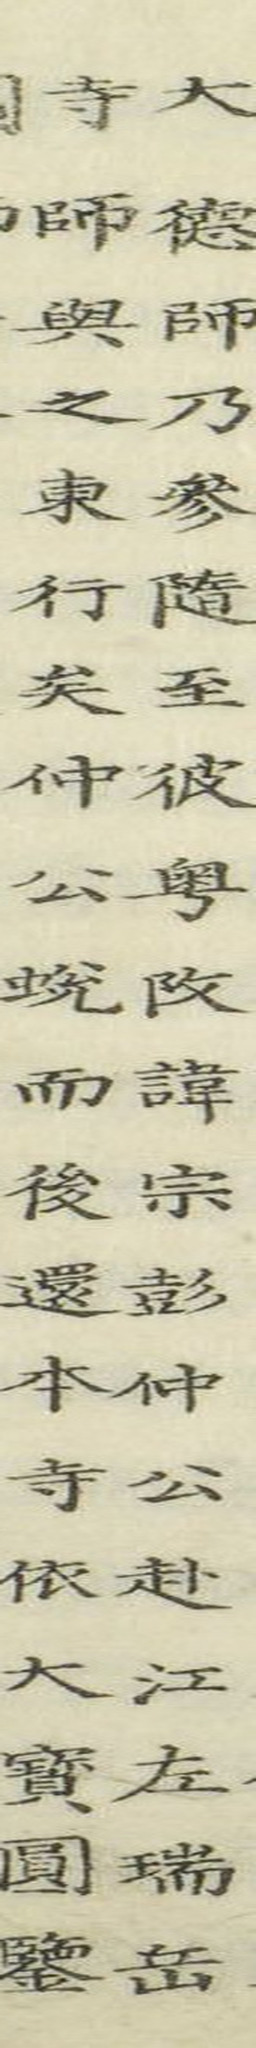寺師與之東行矣仲公蛻而後還本寺依大寳圓鑒
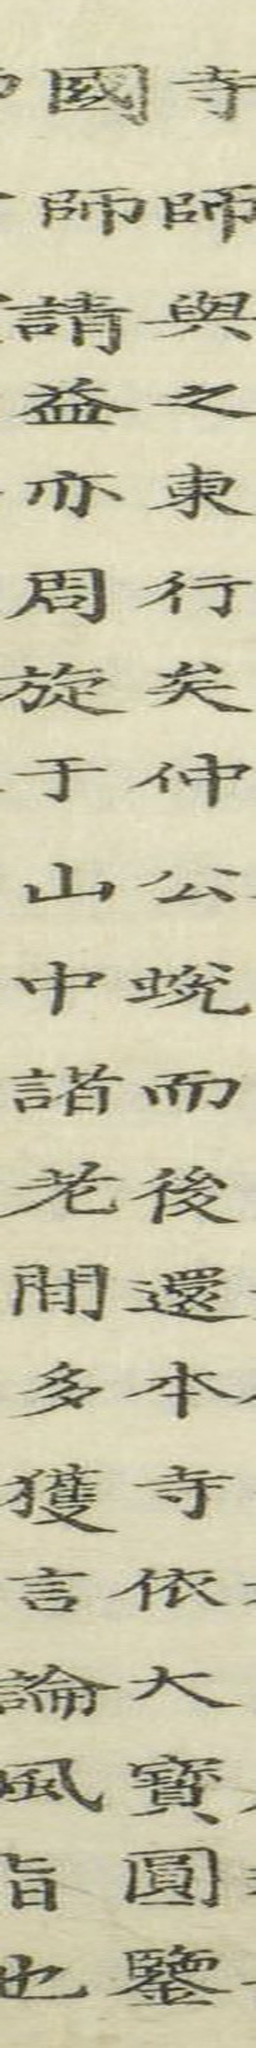國師請益亦周旋于山中諸老閒多獲言論風旨也
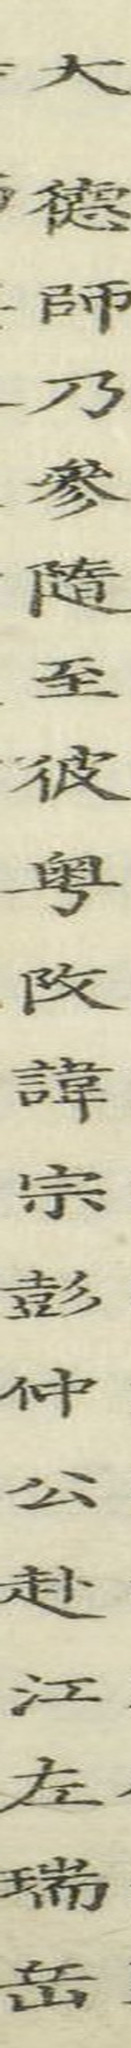大德師乃參隨至彼粤𨸩諱宗彭仲公赴江左瑞岳
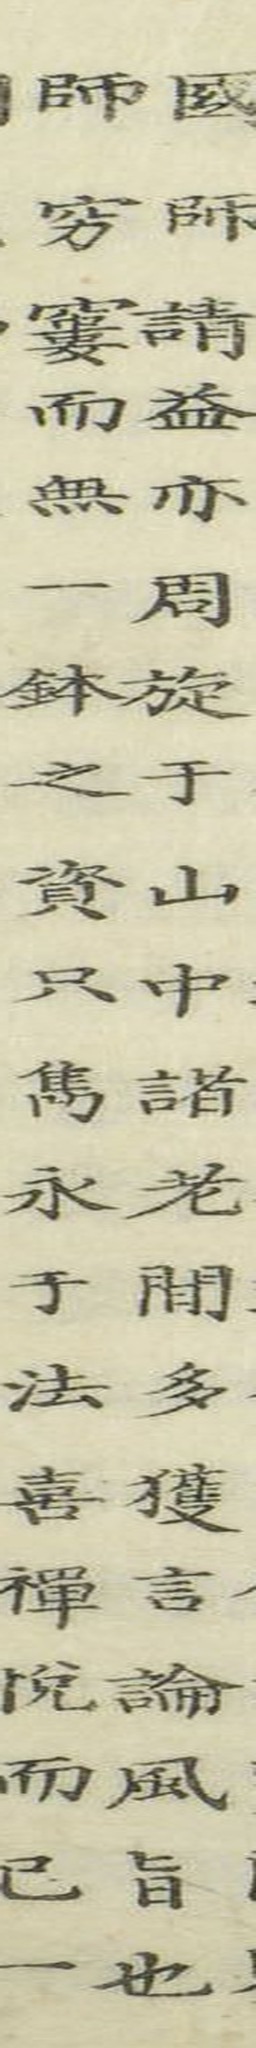師穷窶而無一鉢之資只雋永于法喜禪悅而已一
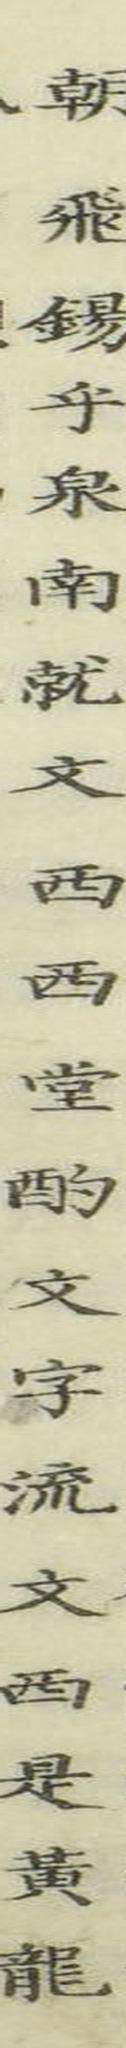朝飛錫乎泉南就文西西堂酌文字流文西是黄龍
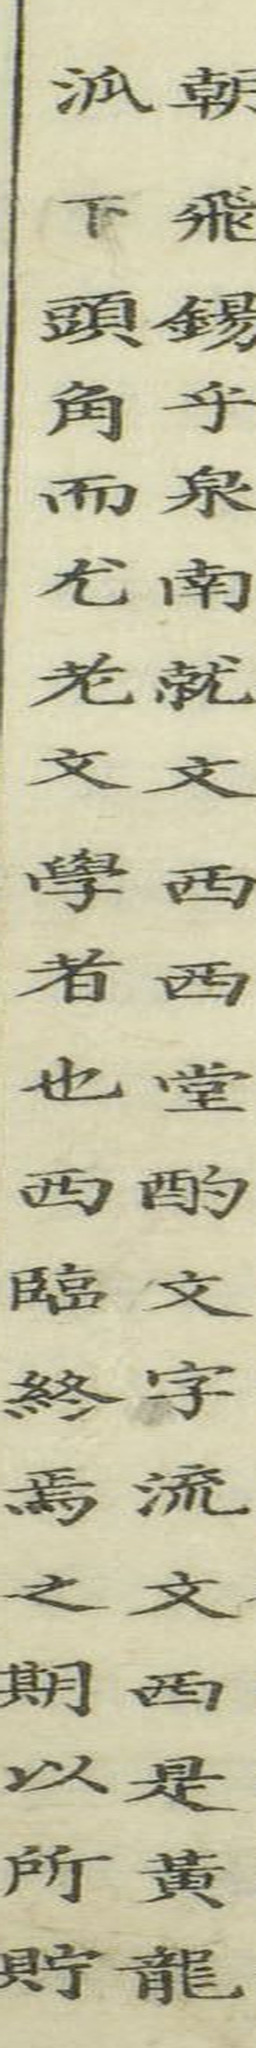泒下頭角而尤老文學者也西臨終焉之期以所貯

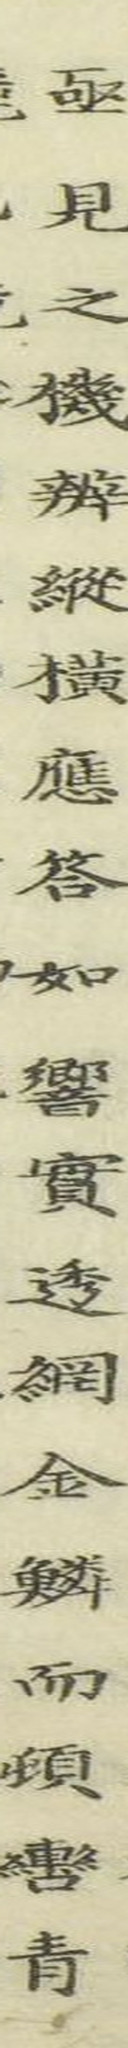亟見之機辨縱横應答如響實透網金鱗而頓轡青
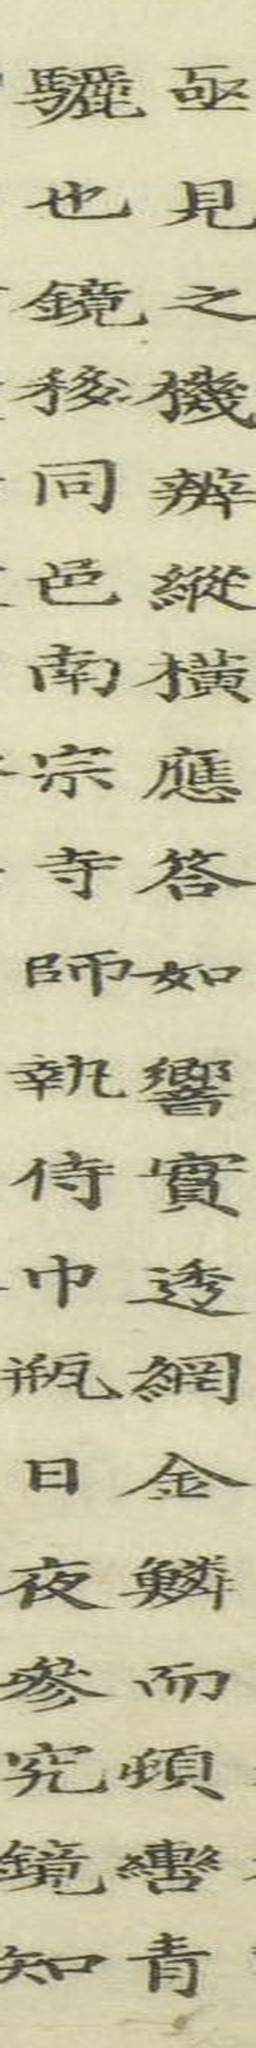驪也鏡移同邑南宗寺師執侍巾瓶日夜參究鏡知
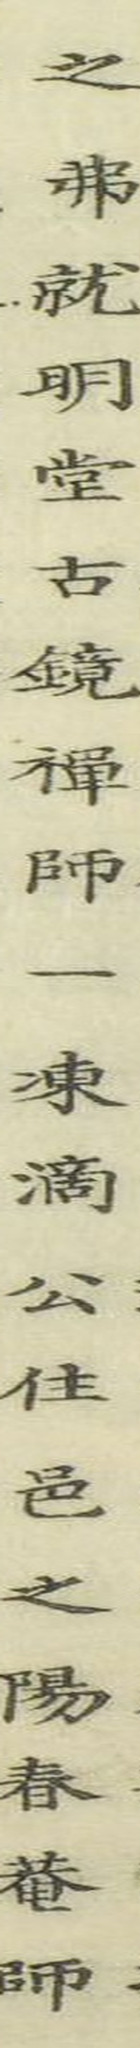之弗就明堂古鏡禪師一凍滴公住邑之陽春菴師
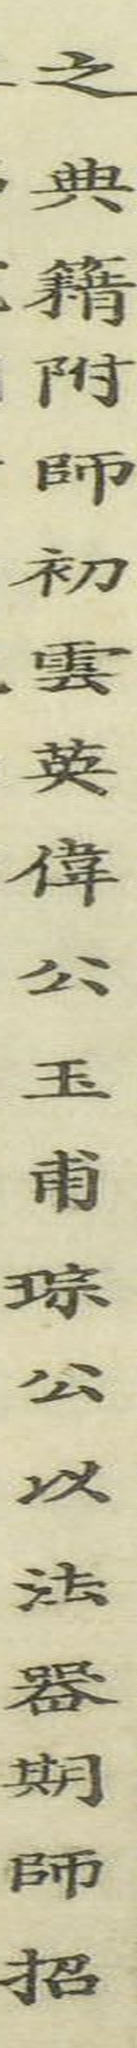之典籍附師初雲英偉公玉甫琮公以法器期師招
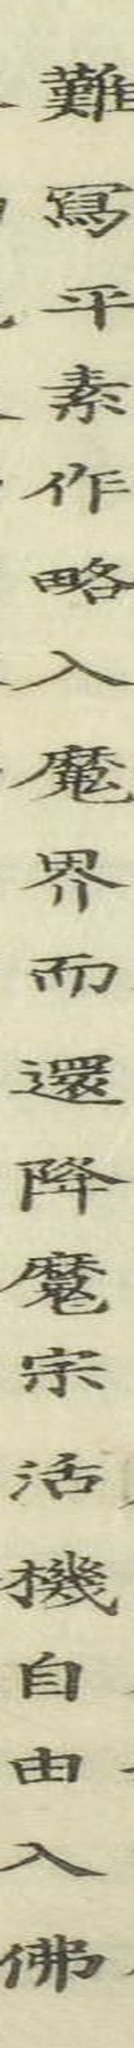難冩平素作略入魔界而還降魔宗活機自由入佛
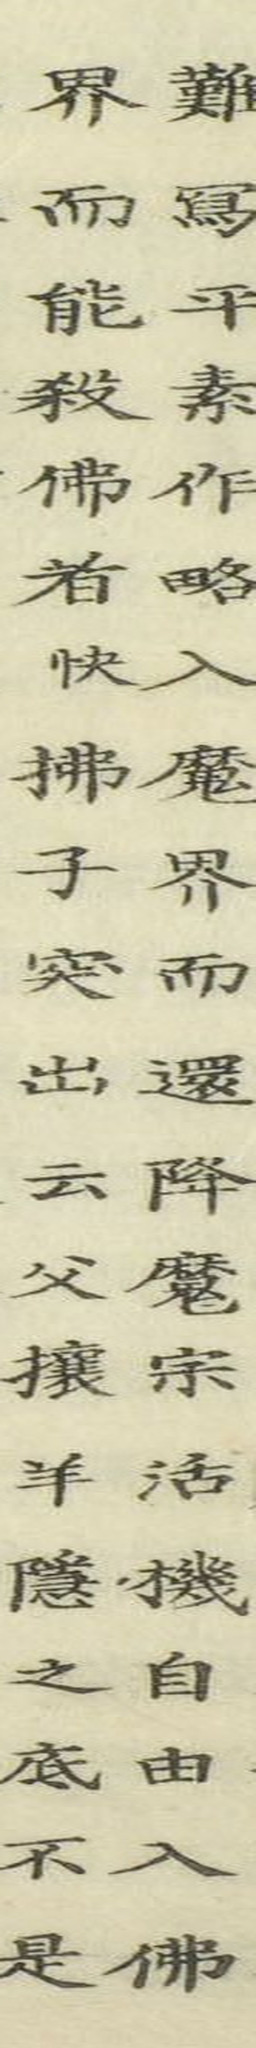界而能殺佛者快拂子突出云父攘羊隱之底不是
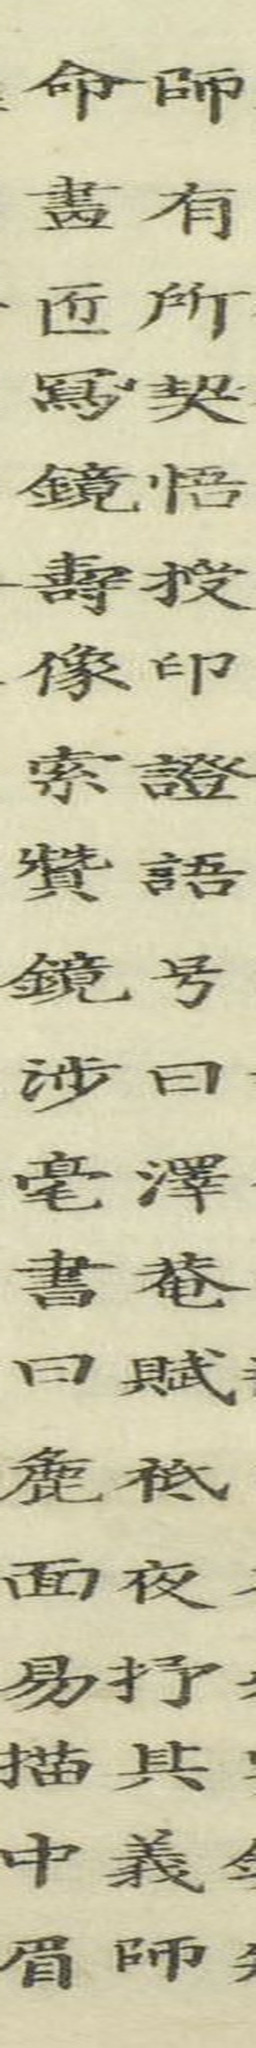命𦘕匠冩鏡壽像索贊鏡渉毫書曰麁面易描中眉
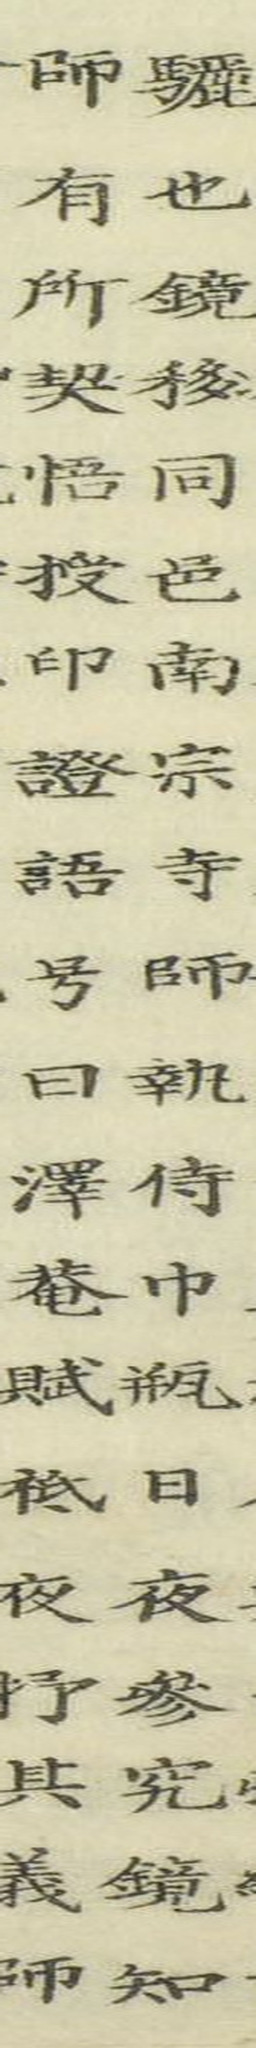師有所契悟授印證語号曰澤菴賦祗夜抒其義師
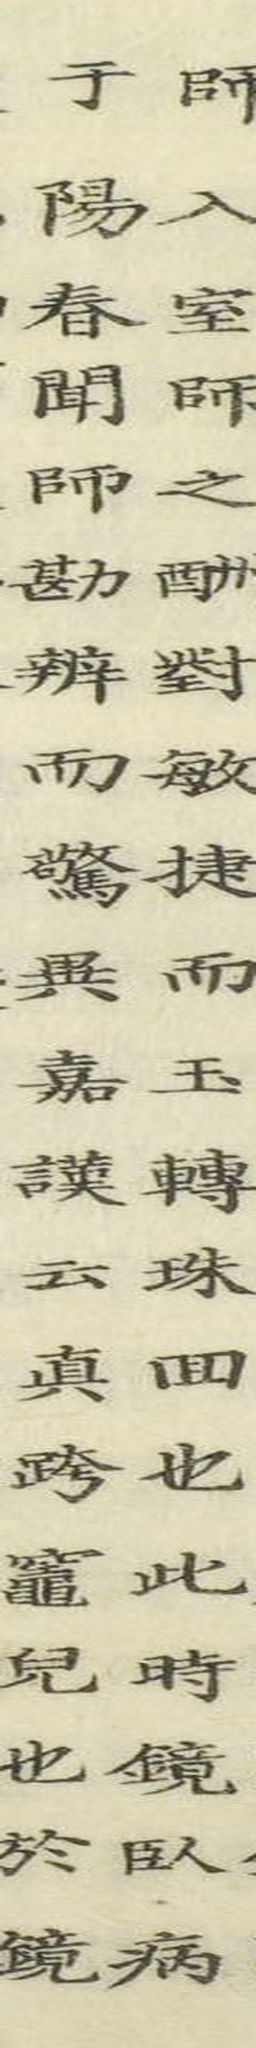于陽春聞師勘辨而驚異嘉謨云眞跨竈兒也於鏡
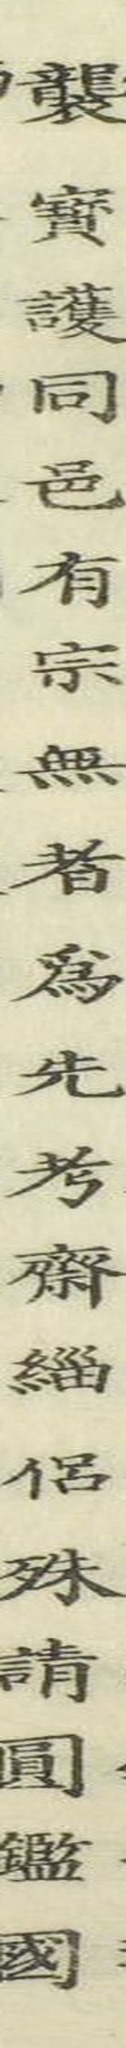襲寳護同邑有宗無者爲先考齋緇侶殊請圓鑑國
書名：江戸名所図会 20巻 巻之4
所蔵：東京学芸大学教育コンテンツアーカイブ
